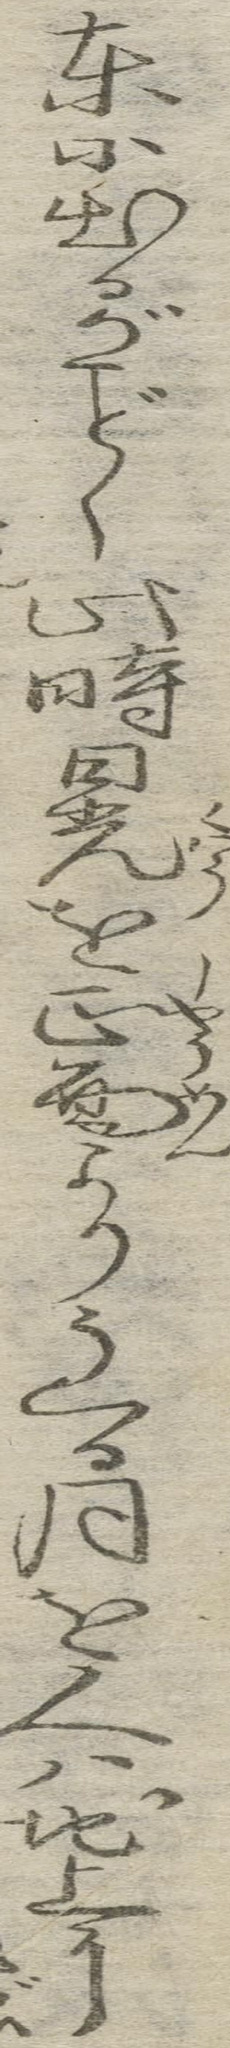東に出るがごとく此時日光を正面よりうくる月を人は地上に
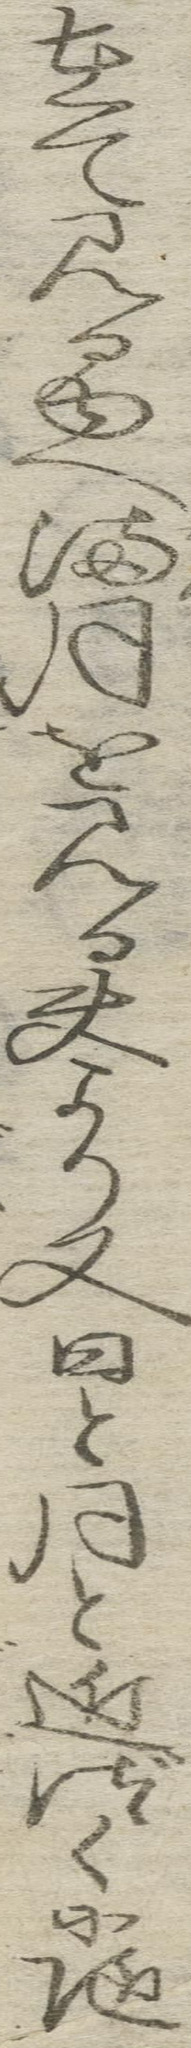在て見るゆへ満月を見る夫よりまた日と月と近づくに随
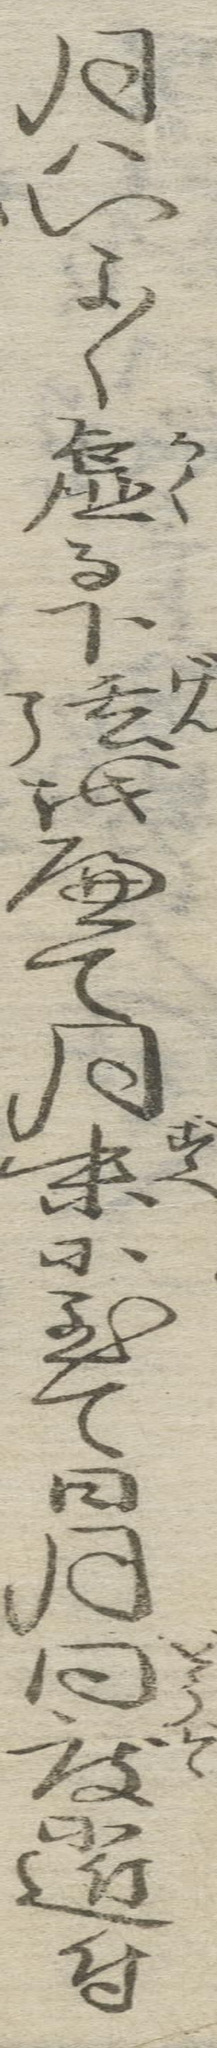月はいよ〳〵虚る下弦をへて月末に至て日月同度に近付
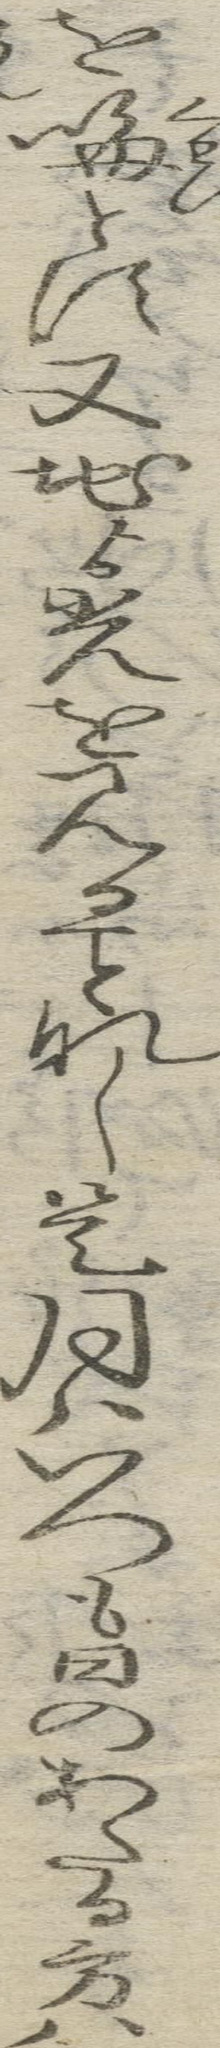を晦とす又地ゟ光を見ることなし是月はいつも日のあたる方は
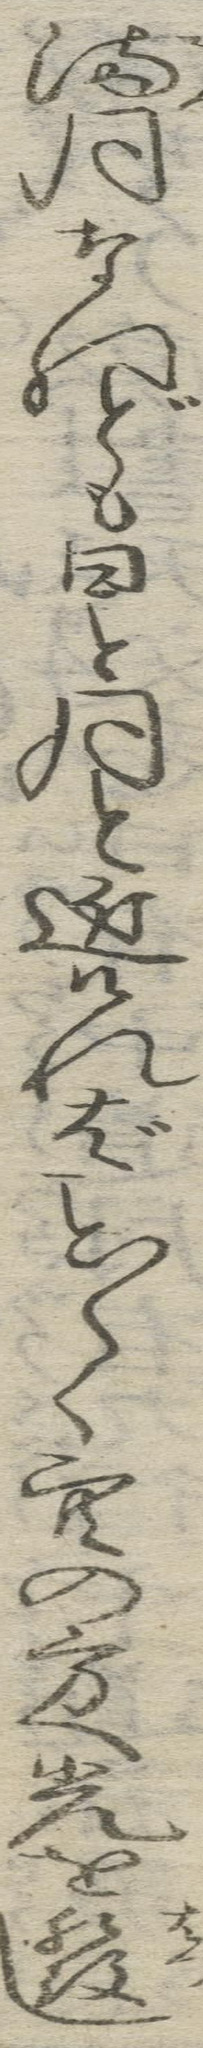満月なれども日と月と近ければこと〳〵く空の方へ光を発し
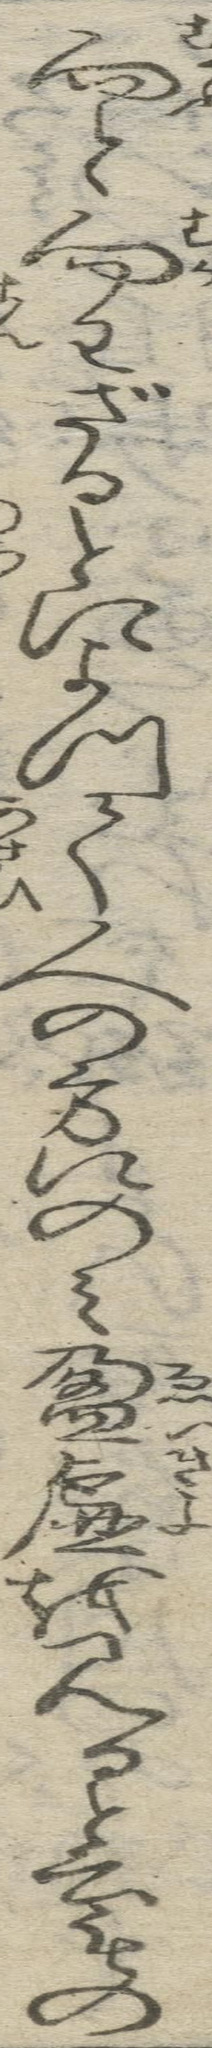向と向わざるとによつて人の方にのみ盈虚を見ると云もの
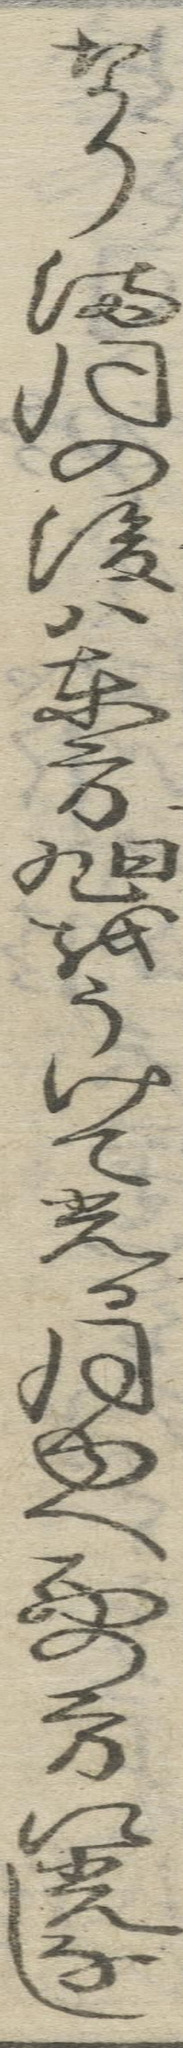なり満月の後は東方旭をうけて光る月ゆへ西の方に光なし
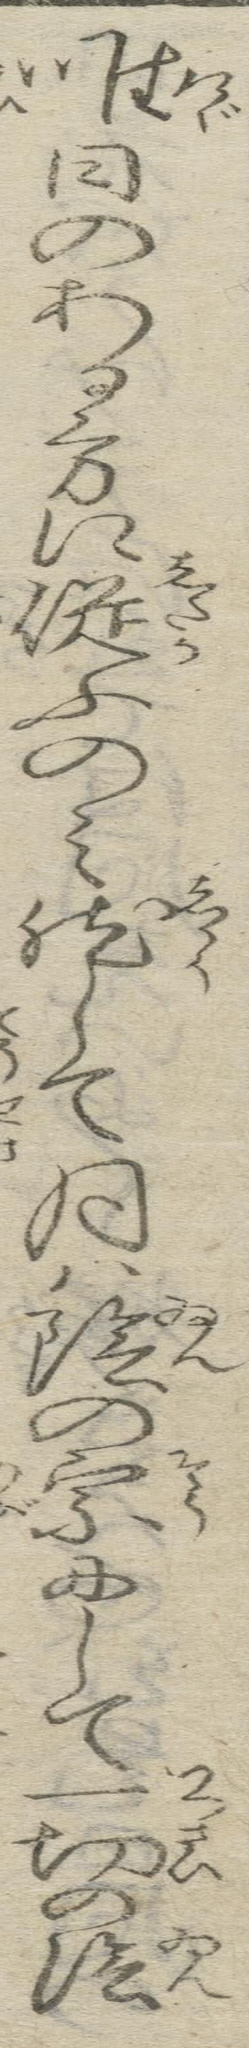唯日のある方に従ふのみ然して月は陰の宗にして一切の陰
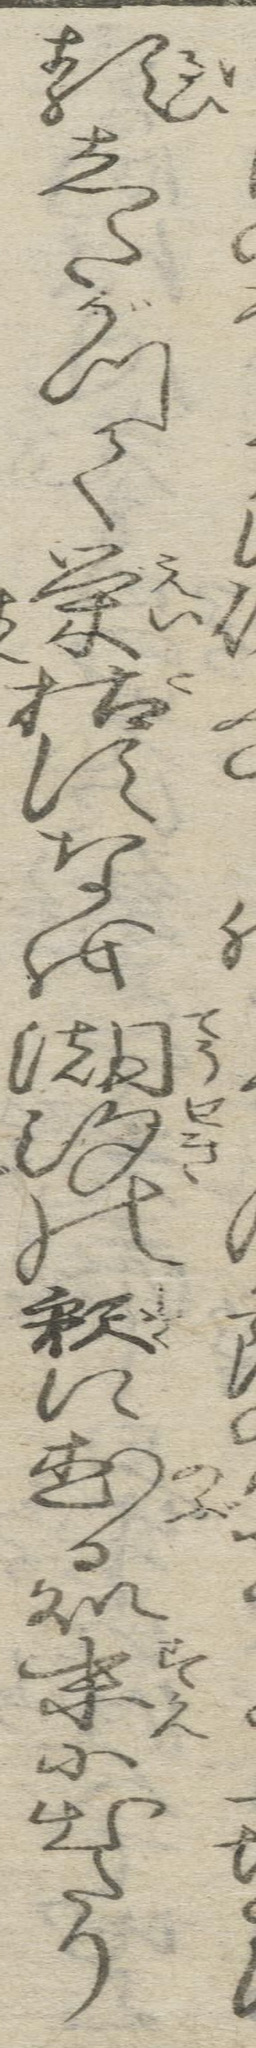類したがつて栄枯すなを潮汐の釈に述る処末に出たり
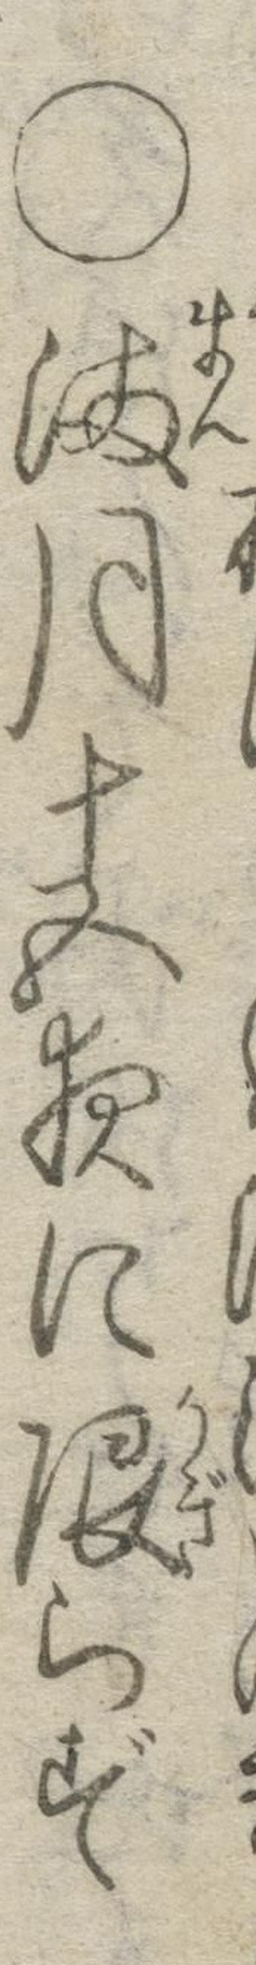○満月十五夜に限らず
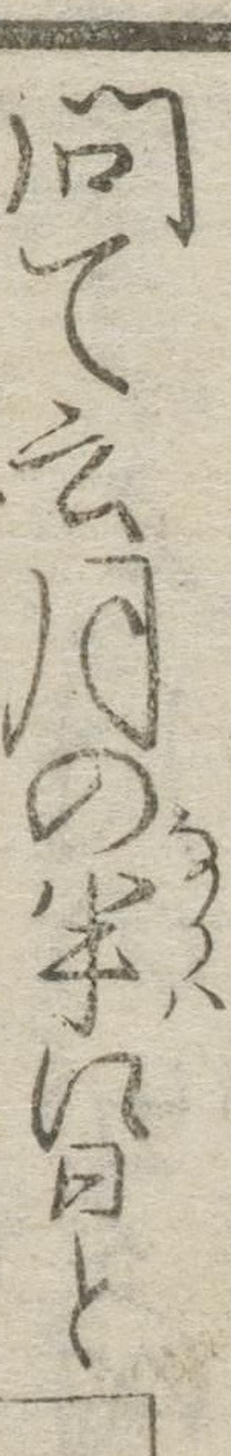問て云月の半に日と
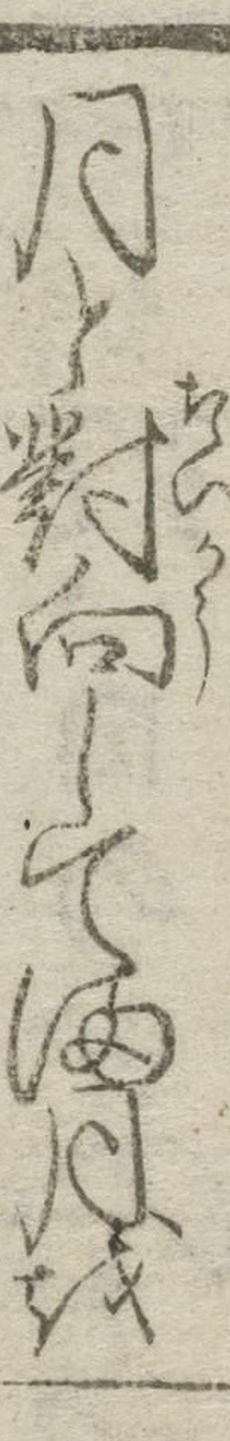月と対向して満月を
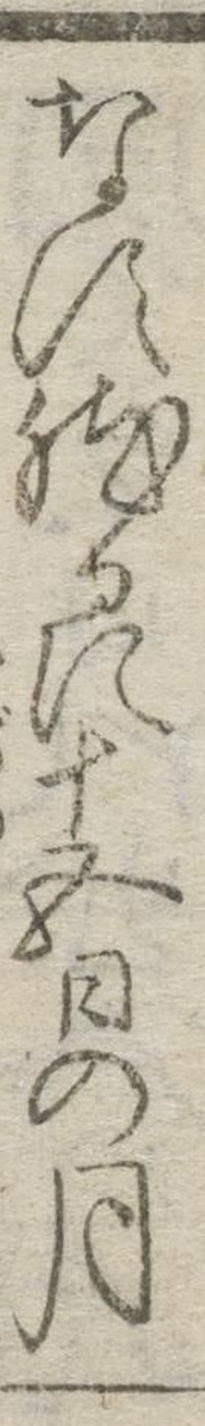なす然るに十五日の月
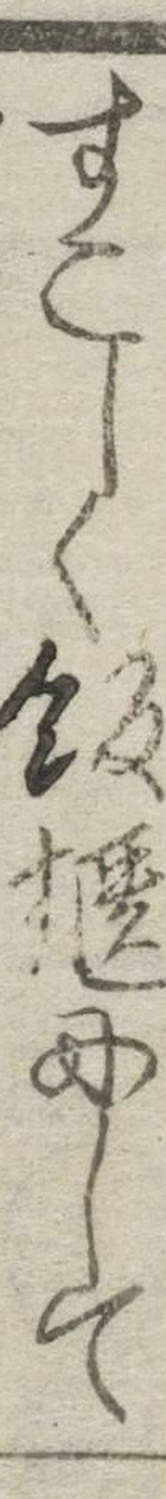すこしく飯櫃にして
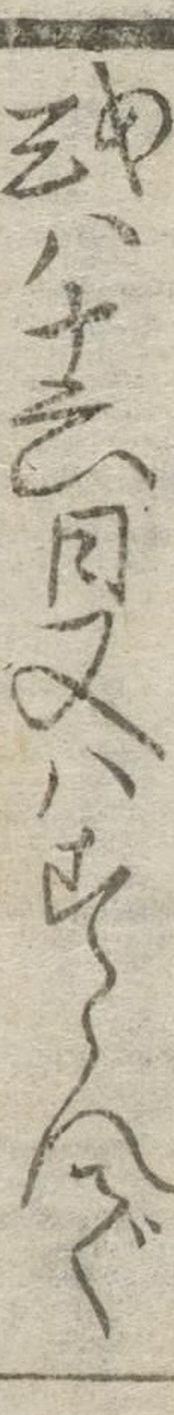或は十六日又はすゝんで
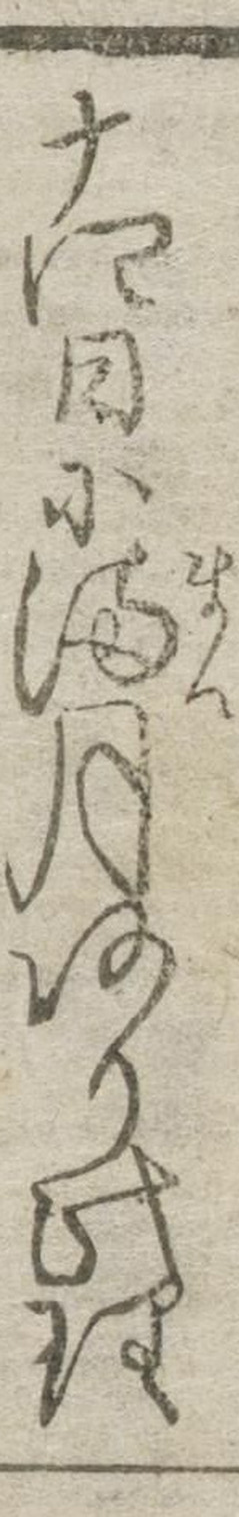十四日に満月ある此理
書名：訓蒙天地辨　天
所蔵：東京大学地震研究所図書室 Earthquake Research Institute Library, The University of Tokyo, JAPAN
